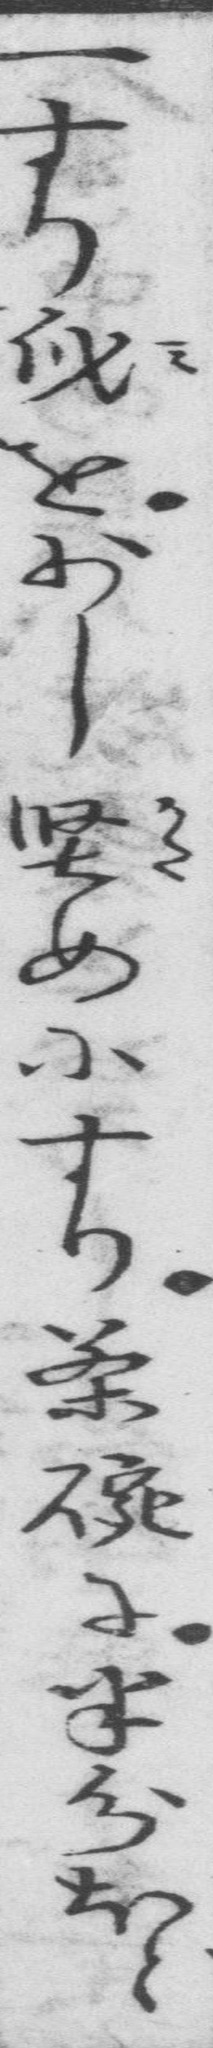一すり身を。少し堅めにすり。茶碗に。半分ほど

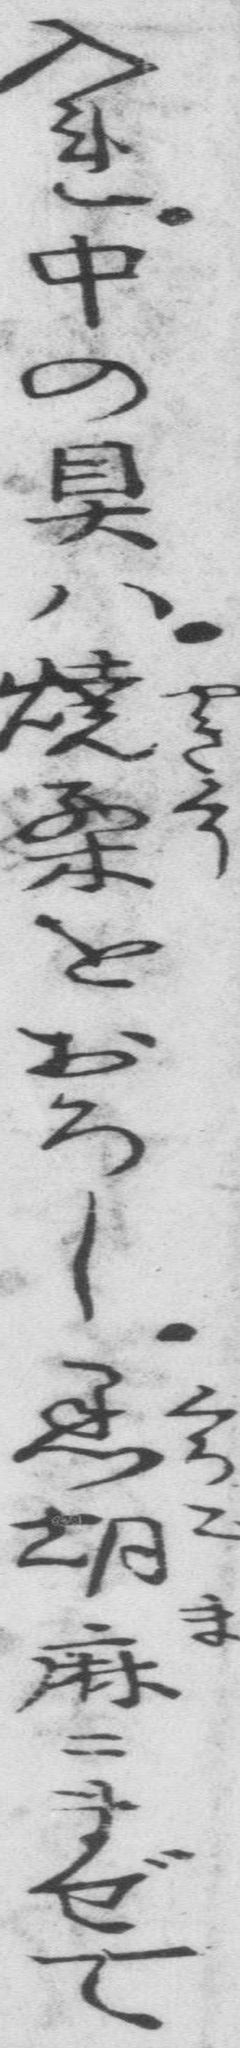入れ。中の具は。焼栗をおろし。黒胡麻にまぜて
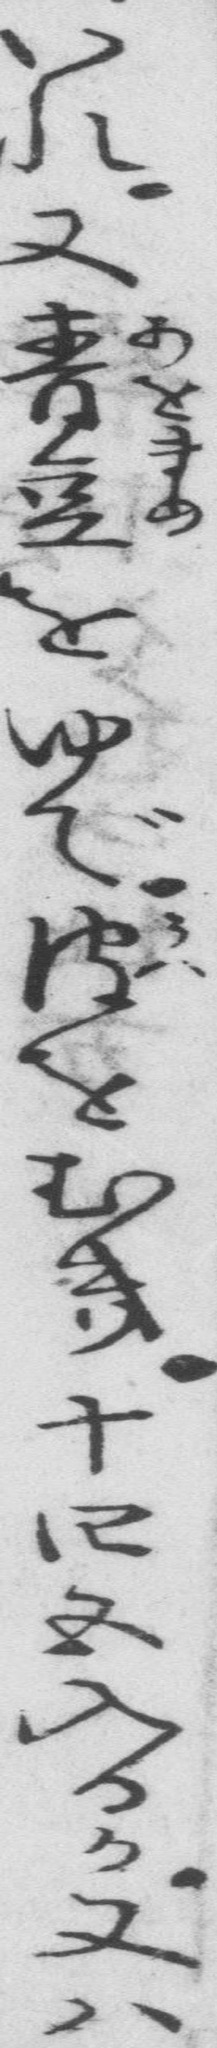いれ。又青豆をゆで。皮をむき。十四五入るか。又は
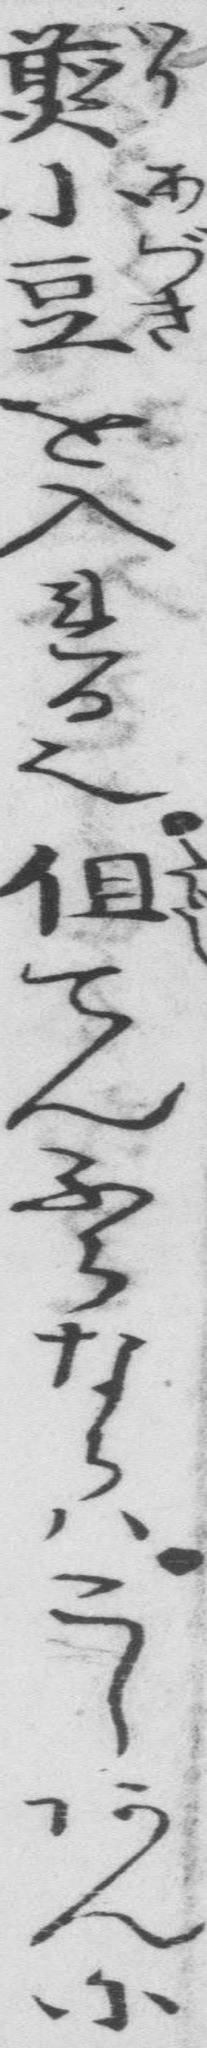煎小豆を入れる也。但てんふらならは。こしあんに
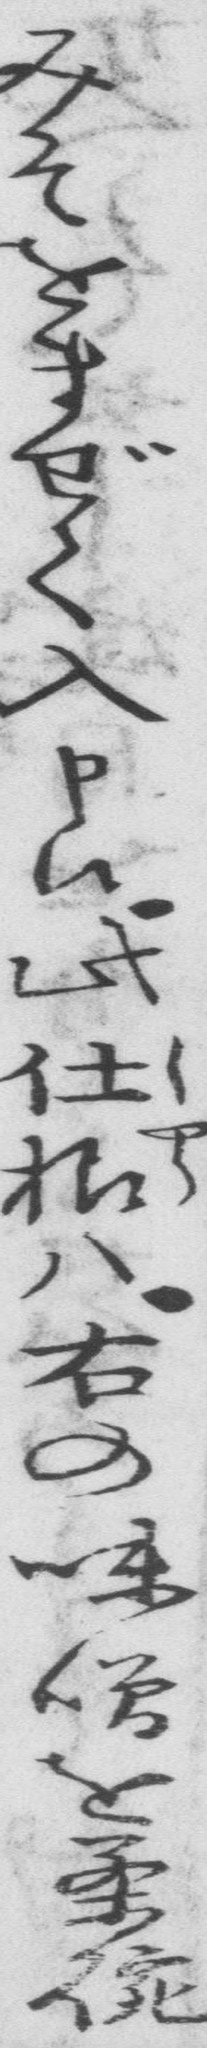みそをまぜて入申候。此仕様は。右の味噌を茶碗
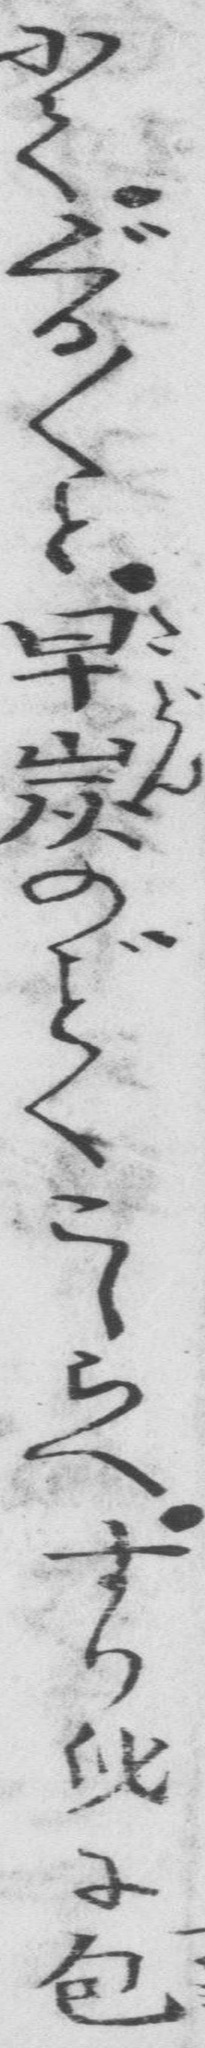にて。ぐる〳〵と。早炭のごとくこしらへ。すり身に包
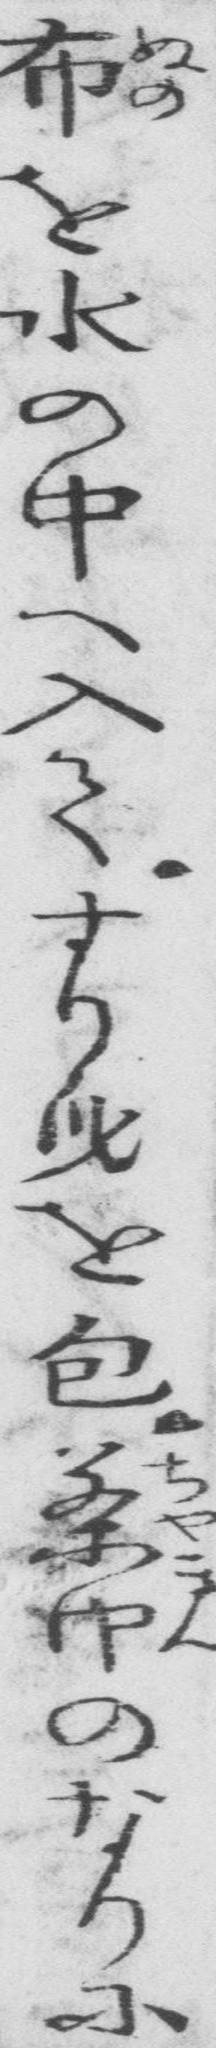布を水の中へ入て。すり身を包。茶巾のなりに
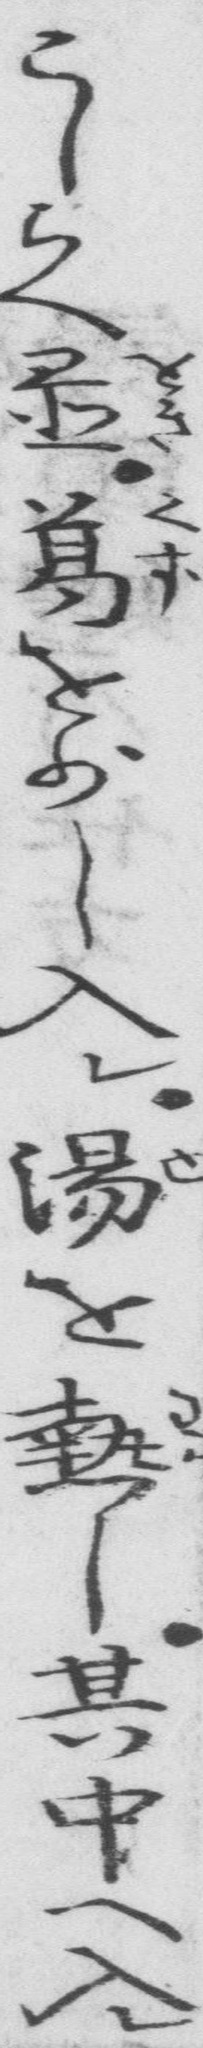こしらへ置。葛を少し入れ。湯を熱し。其中へ入れ
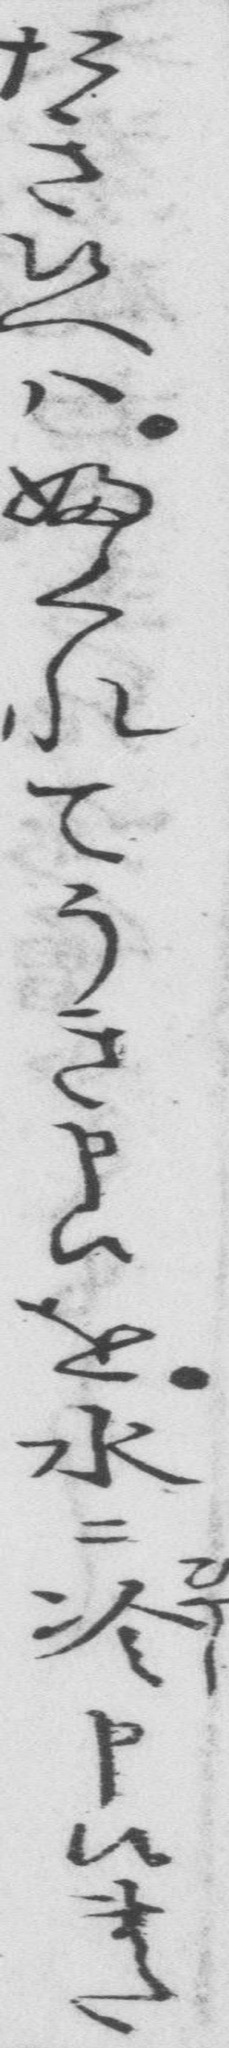おき候へは。ふくれてうき申候を。水に冷申候また
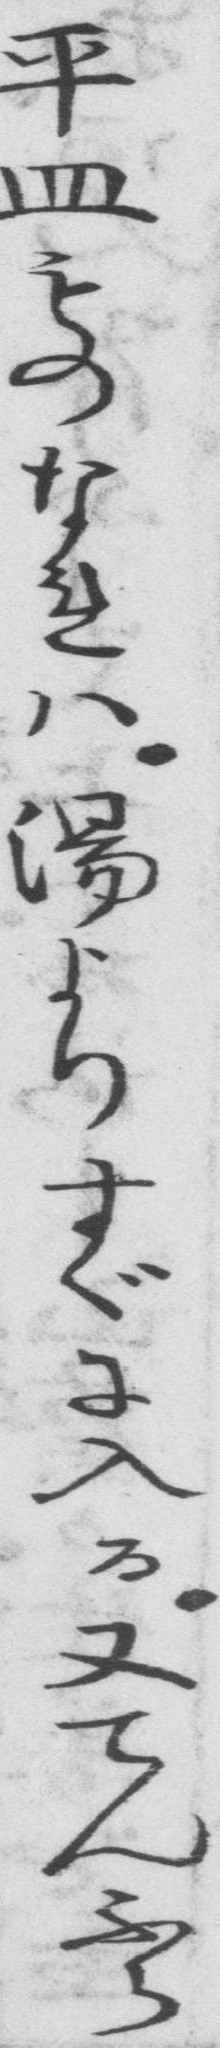平皿ものなれは。湯よりすぐに入る。又てんふら
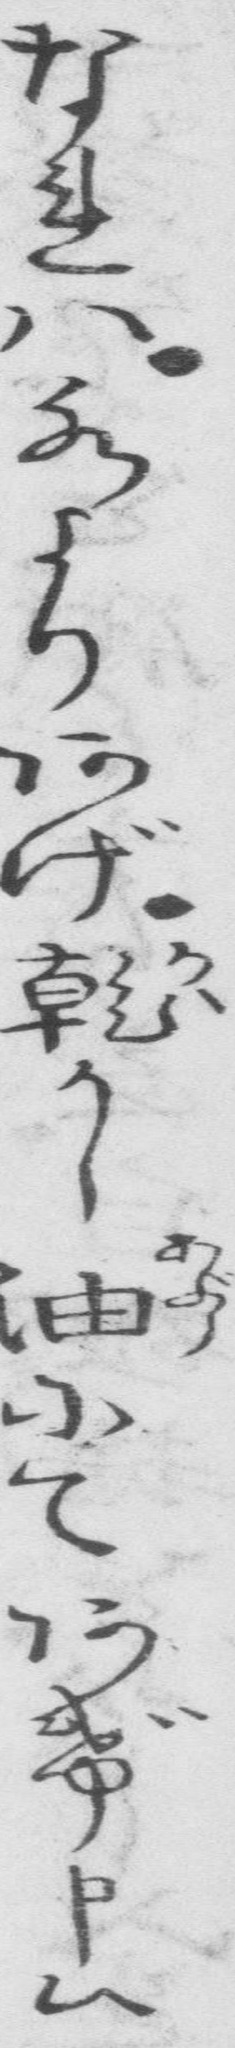なれは。水よりあげ。乾かし油にてあげ申候
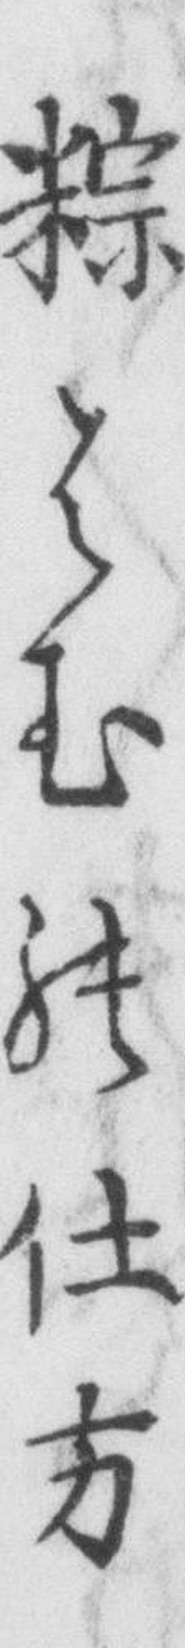粽はむの仕方
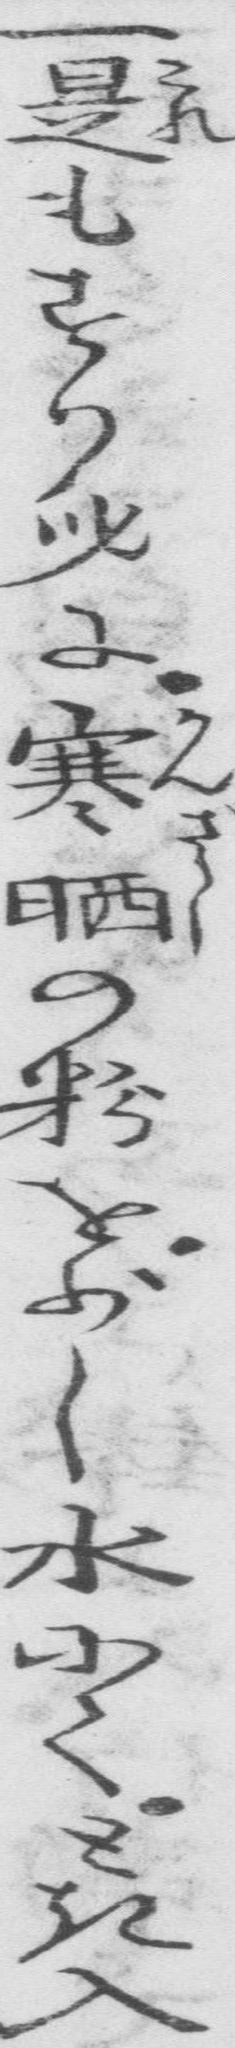一是もすり身に。寒晒の粉を。少し水にて。とき入
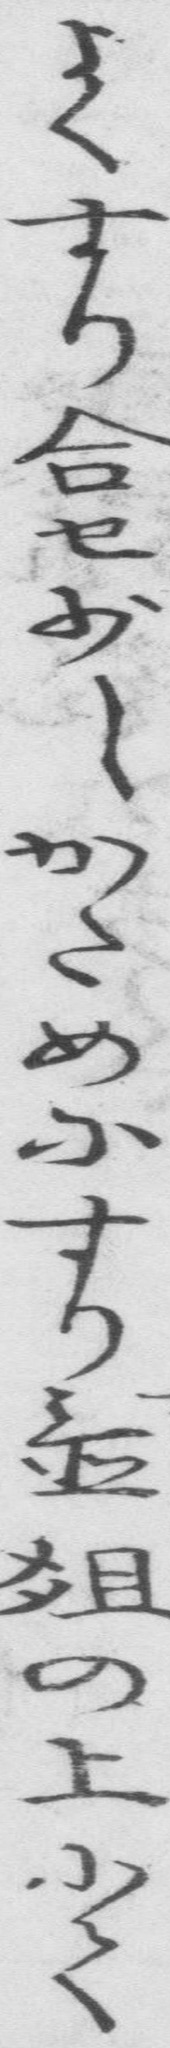よくすり合せ。少しかためにすり置。俎の上にて
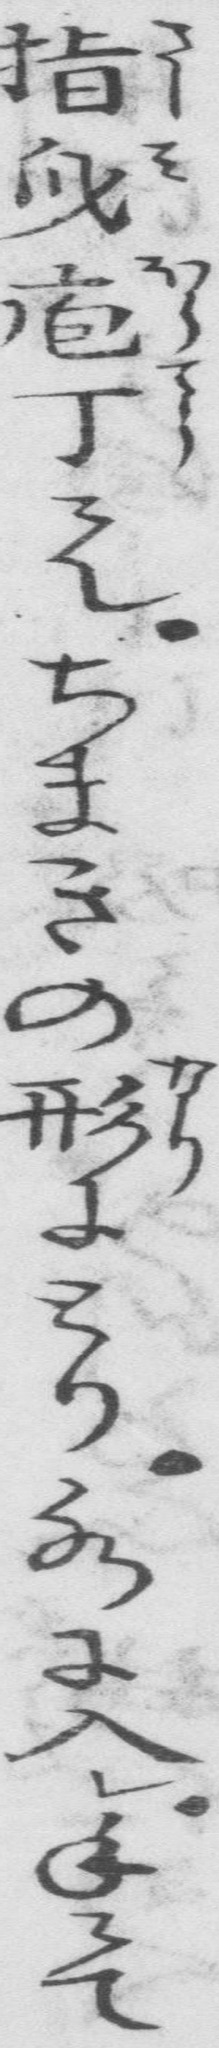指身包丁にて。ちまきの形にとり。水に入れ。手にて
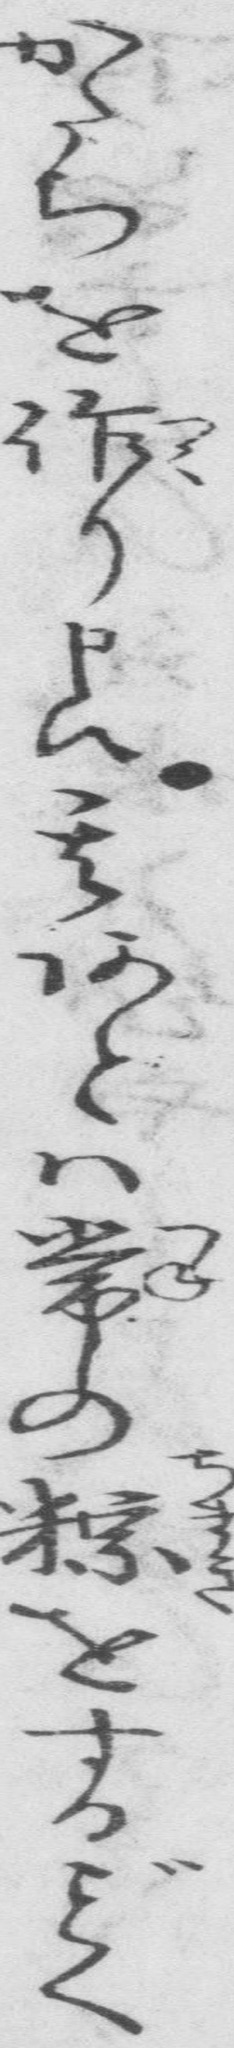かたちを作り申候。其あとは常の粽をするごとく
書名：萬寳料理秘密箱
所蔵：大阪府立大学学術情報センター 国文学研究資料館
